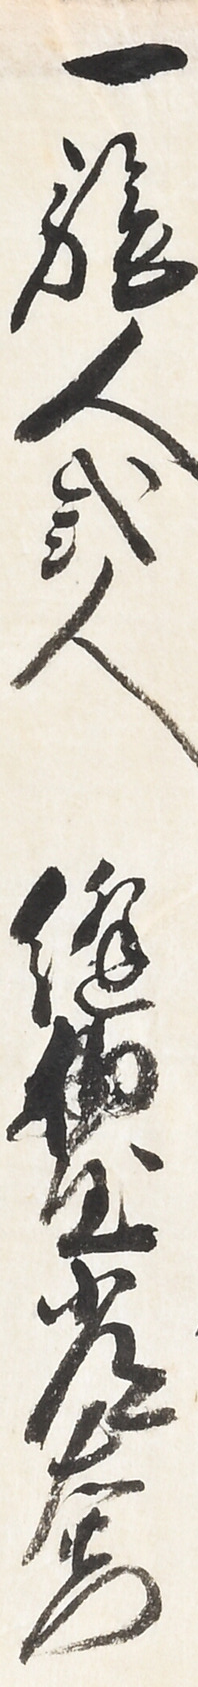一旅人弐人縫伯屋常右衛門
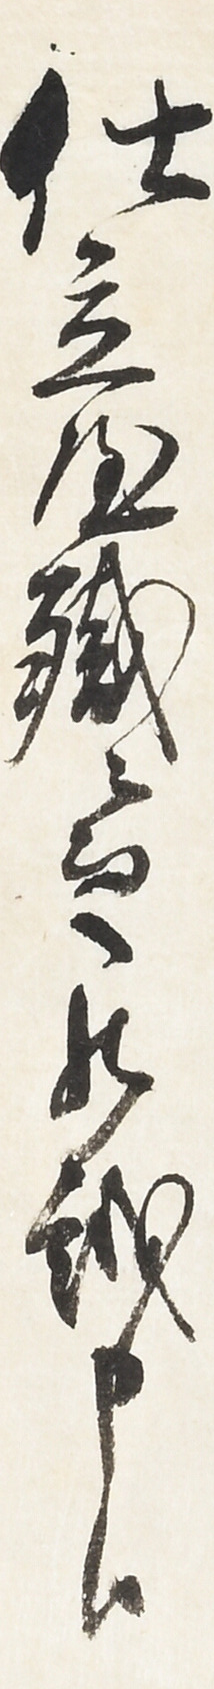仕立屋職ニ而罷越申候
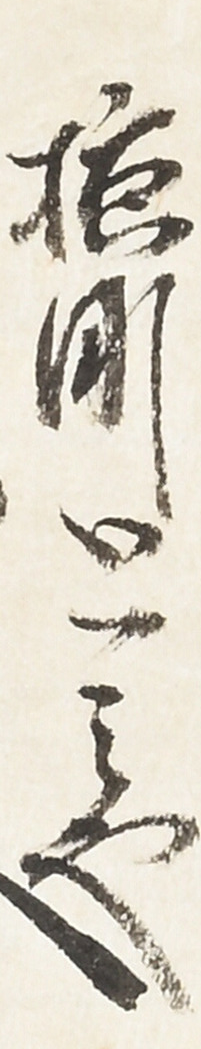横町とみや
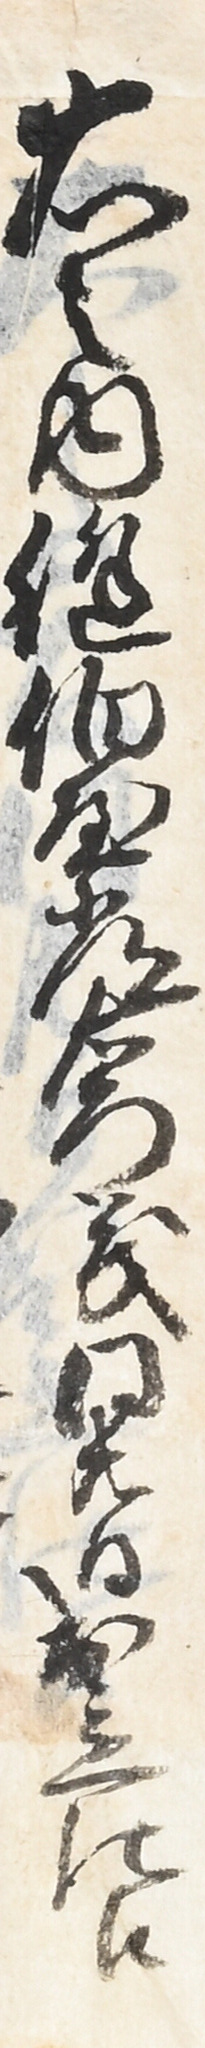右之者縫伯屋常右衛門義同廿日出立仕候
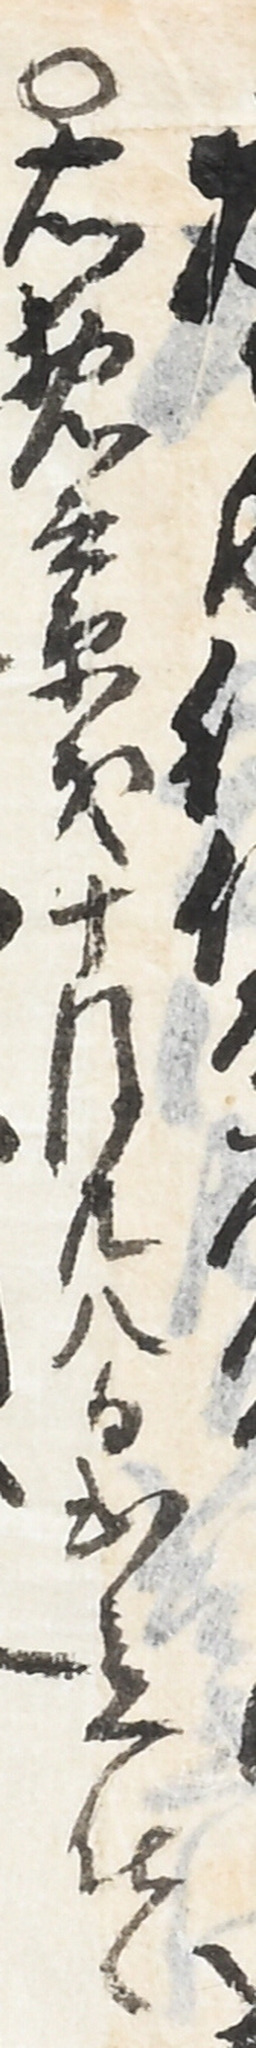〇右惣兵衛儀十月廿八日出立仕候
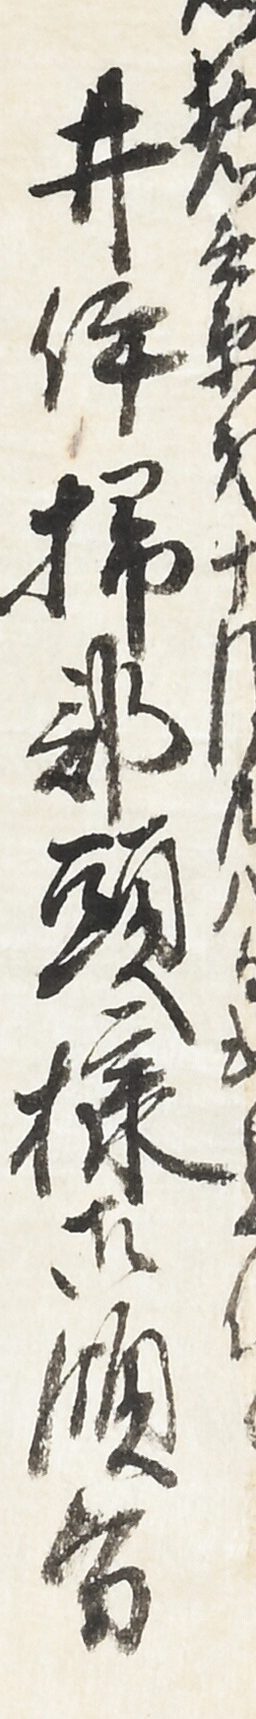井伊掃部頭様御領分
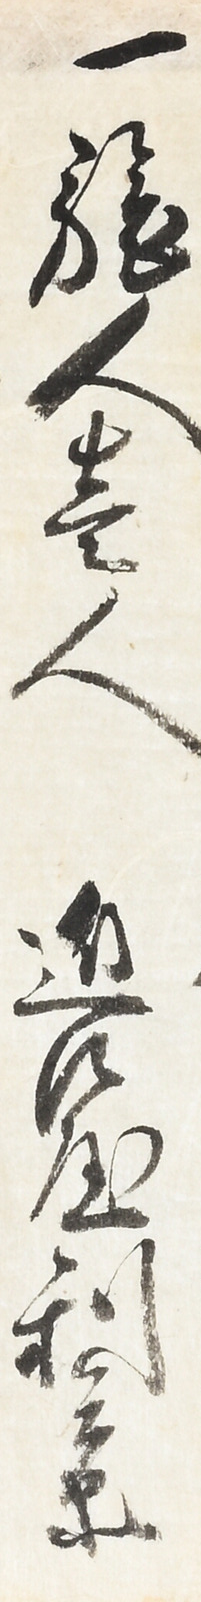一旅人壱人近江屋利兵衛

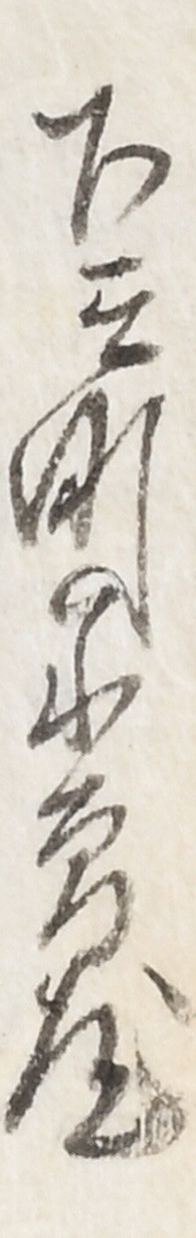下モ町木曽屋
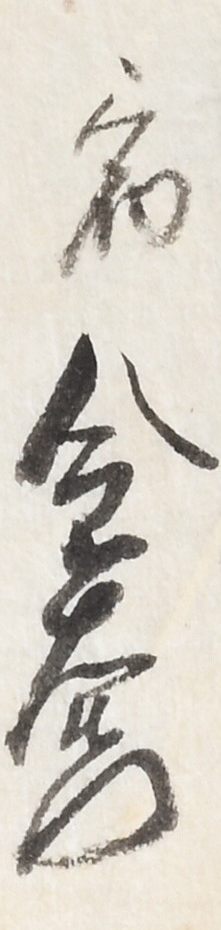宿金右衛門
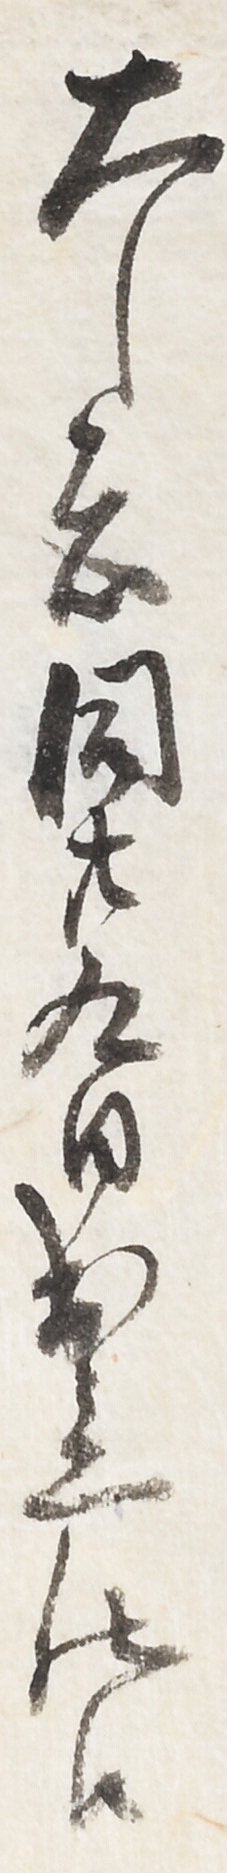右之者同廿九日出立仕候
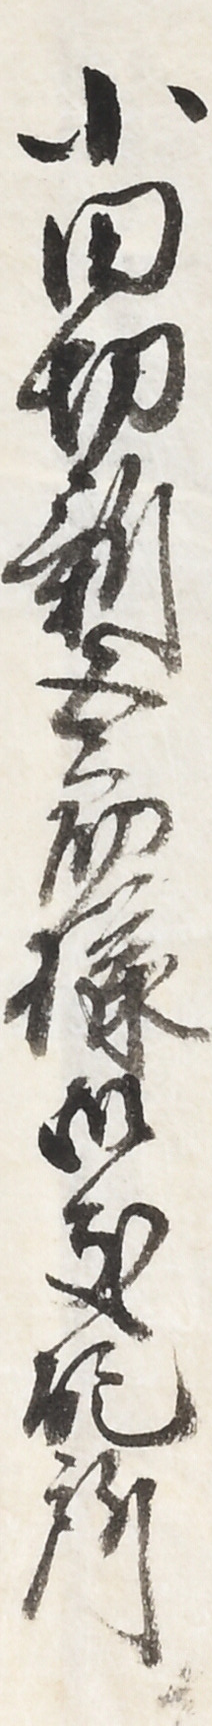小田切新五郎様御支配所
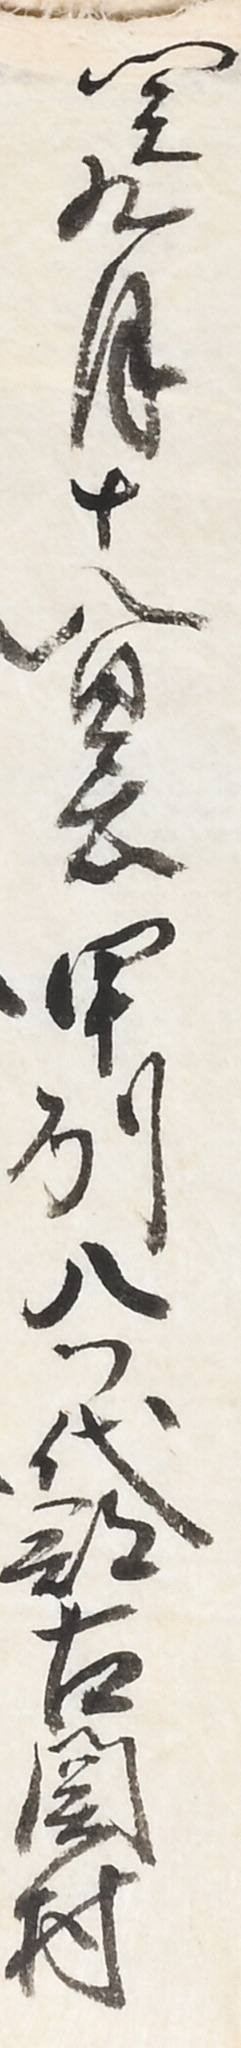閏九月十八日着甲州八ツ代郡古関村
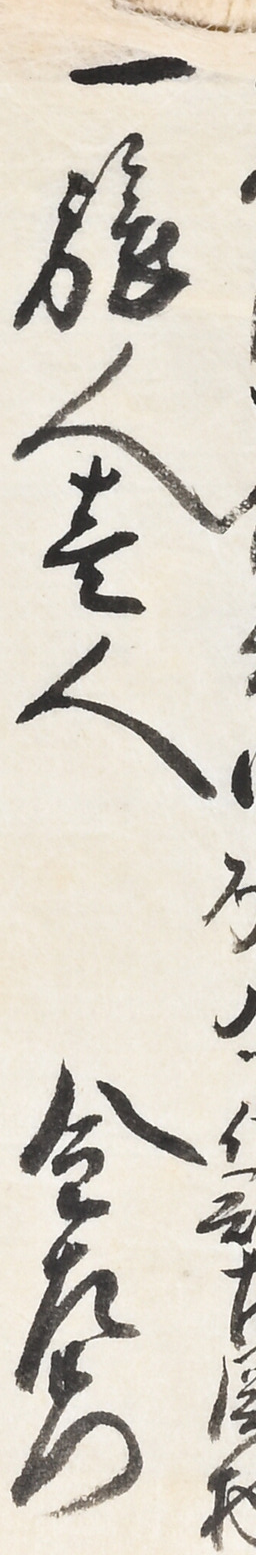一旅人壱人金左衛門
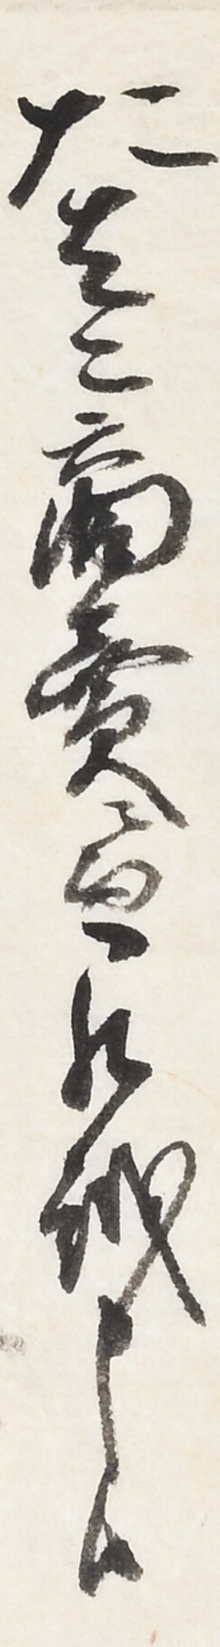たはこ商売ニ而罷越申候
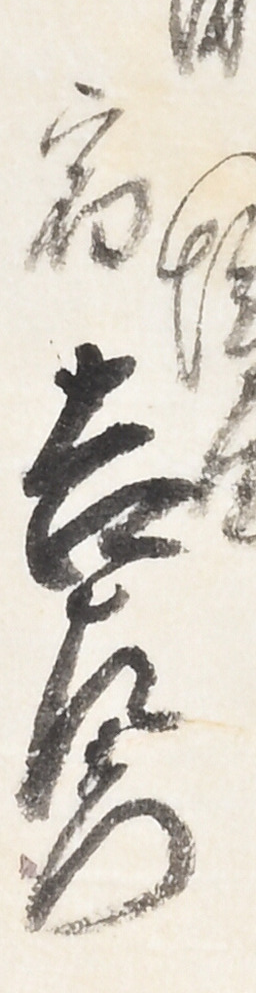宿吉左衛門
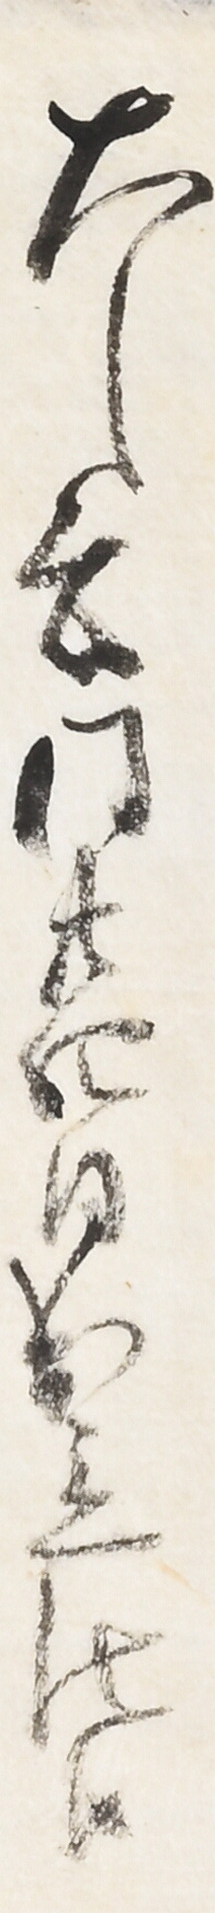右之者同廿四日出立仕候
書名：旅人泊控帳
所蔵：伊那市立高遠町図書館・合同会社AMANE
